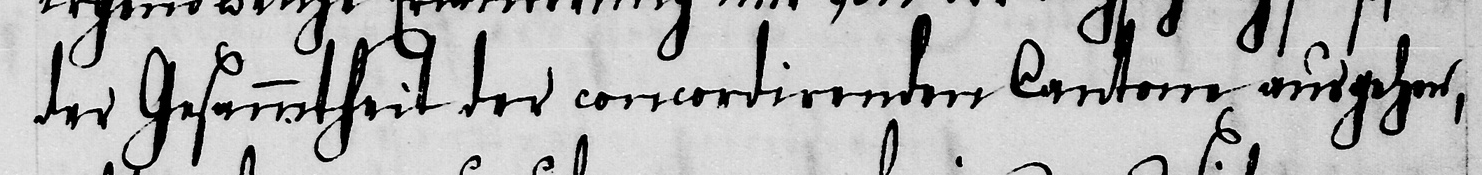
der Gesammtheit der concordirenden Cantone ausgehen,
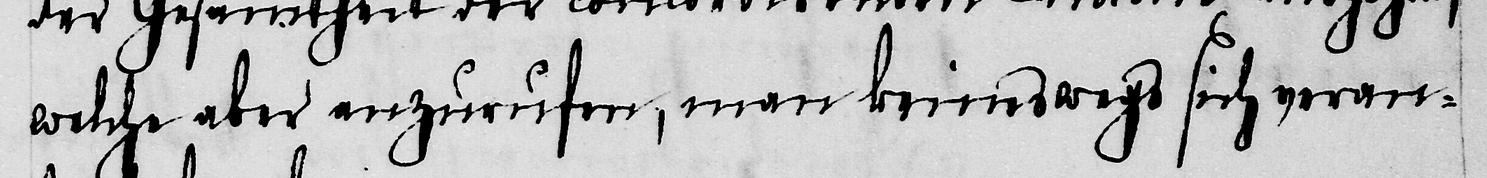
welche aber anzurufen, man keineswegs veran¬
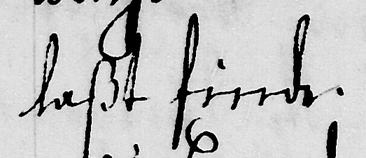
laßt finde.
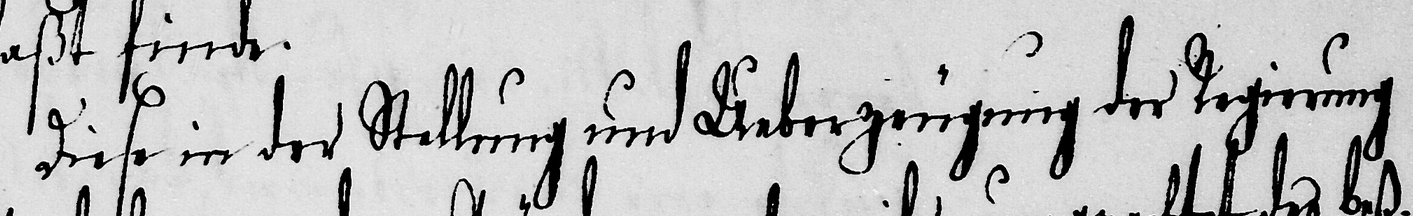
Diese in der Stellung und Ueberzeugung der Regierung
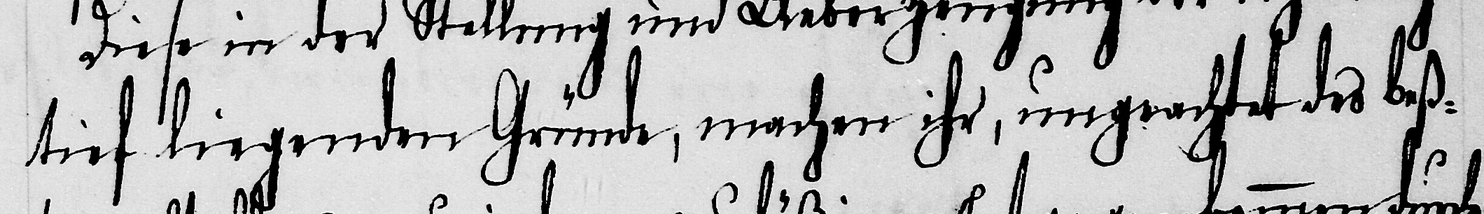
tief liegenden Gründe, machen ihr, ungeachtet des beß¬
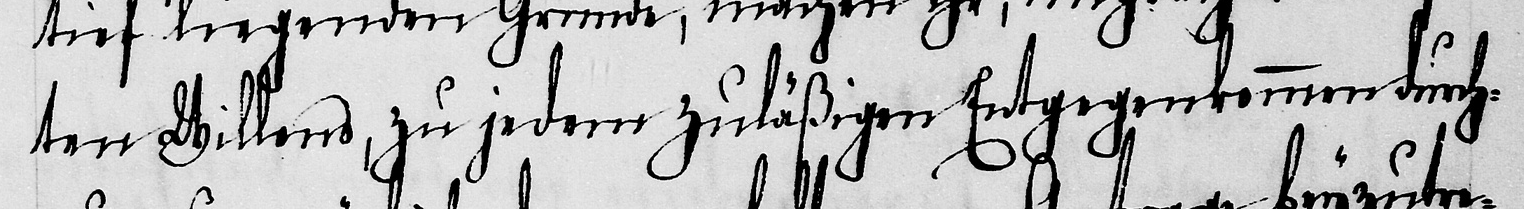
ten Willens, zu jedem zuläßigen Entgegenkommen durch¬
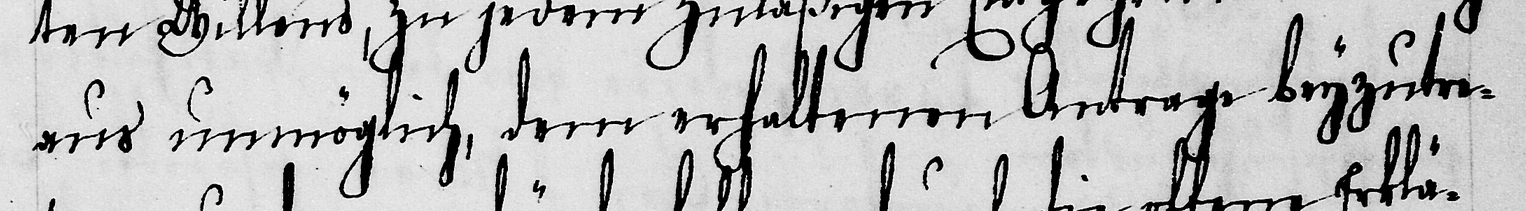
aus unmöglich, dem erhaltenen Antrage beyzutre¬
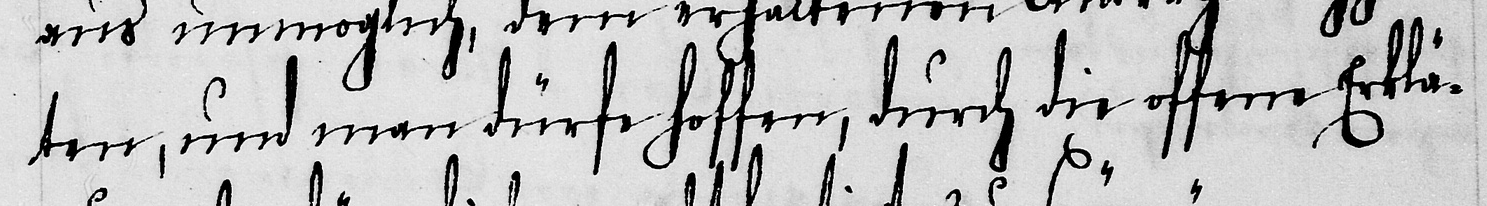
ten, und man dürfe hoffen, durch die offene Erklä¬
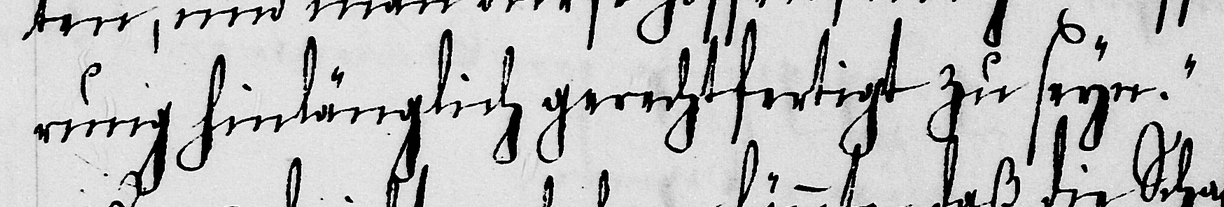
rung hinlänglich gerechtfertigt zu seyn.“
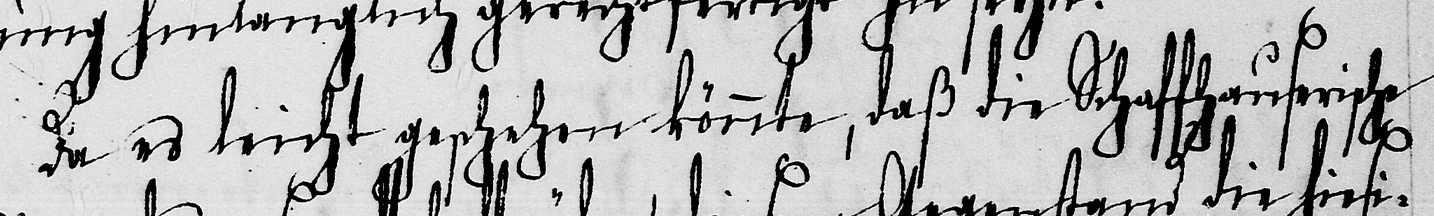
Da es leicht geschehen könnte, daß die Schaffhauserisc¬
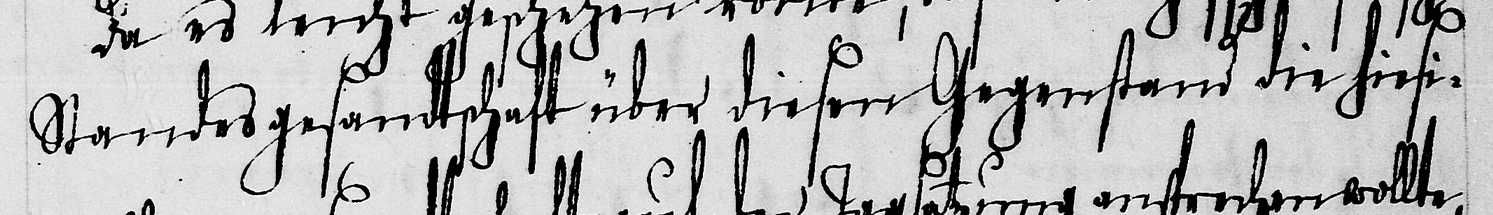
Standesgesandtschaft über diesen Gegenstand die hiesi¬
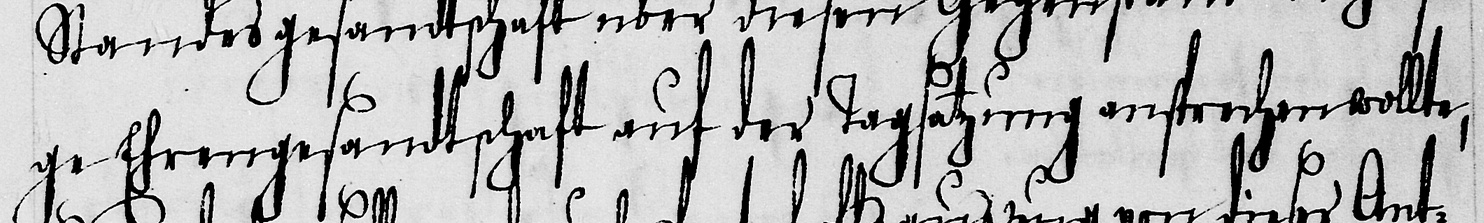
ge Ehrengesandtschaft auf der Tagsatzung ansprechen wollt¬
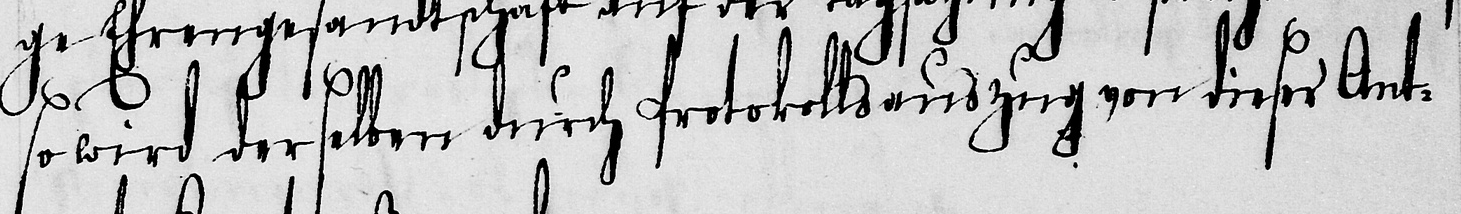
so wird derselben durch Protokollsauszug von dieser Ant¬
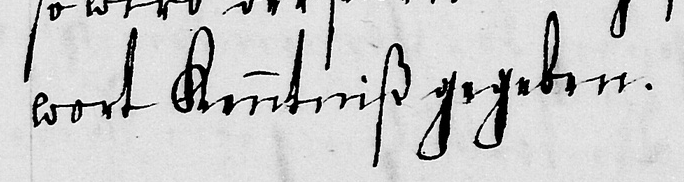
wort Kenntniß gegeben.
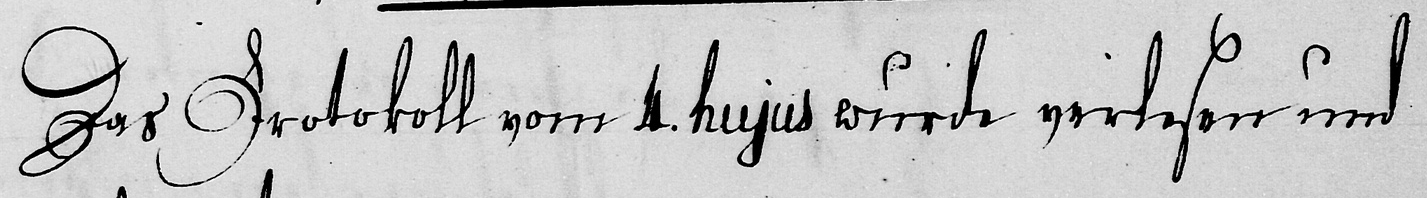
Das Protokoll vom 4. hujus wurde verlesen und
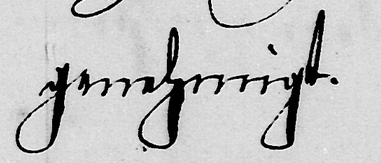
genehmigt.
